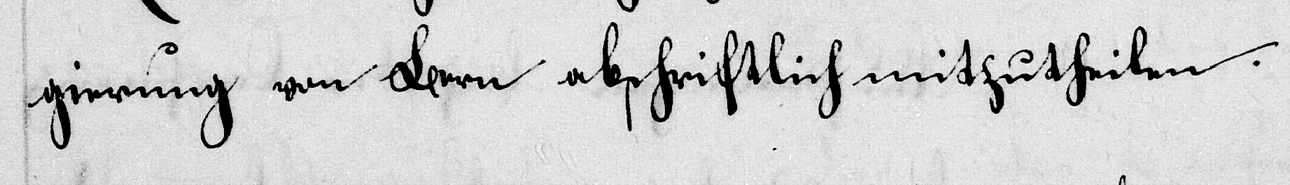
gierung von Bern abschriftlich mitzutheilen.
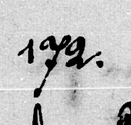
ge¬
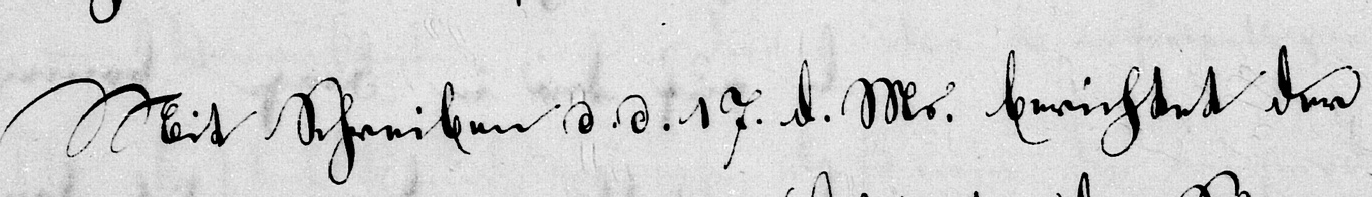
Mit Schreiben d. d. 17. d. Ms. berichtet der
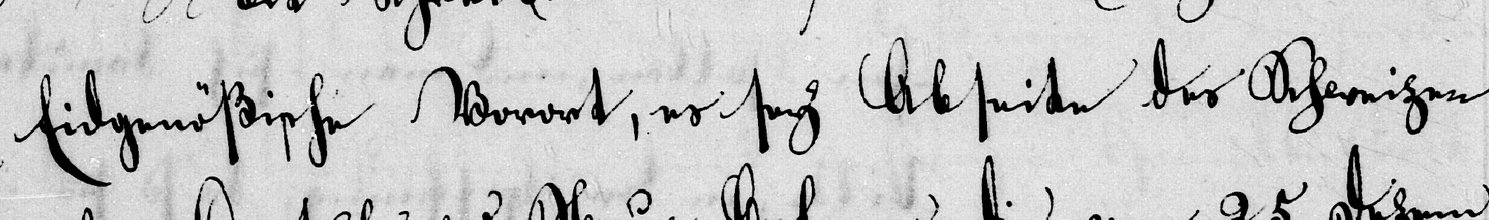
Eidgenößische Vorort, es sey Abseite des Schweize¬
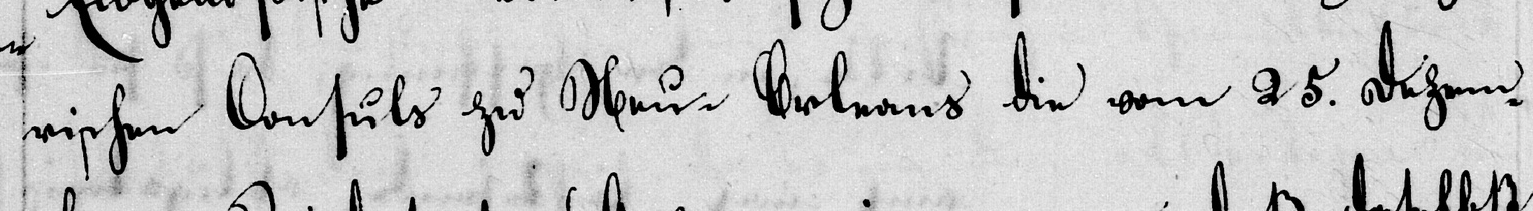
rischen Consuls zu Neu-Orleans die vom 25. Dezem¬
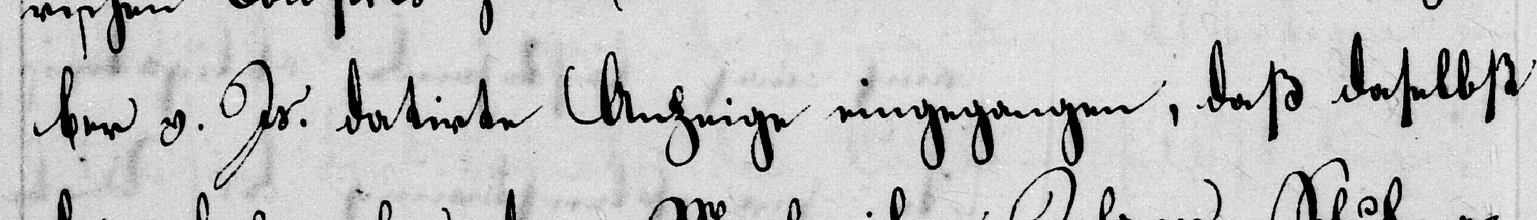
ber v. Js. datirte Anzeige eingegangen, daß daselbst
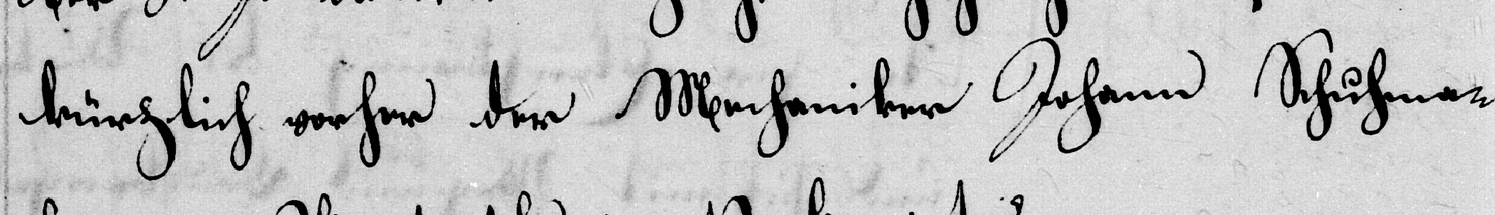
kürzlich vorher der Mechaniker Johann Schuhma¬
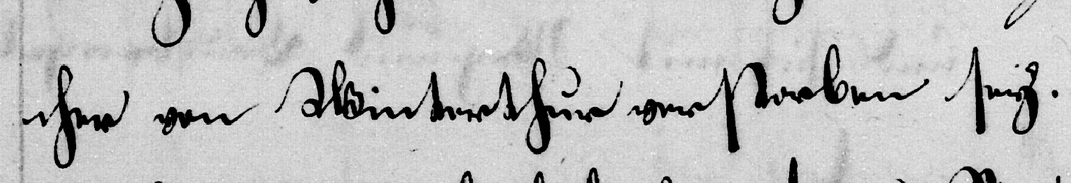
cher von Winterthur verstorben sey.
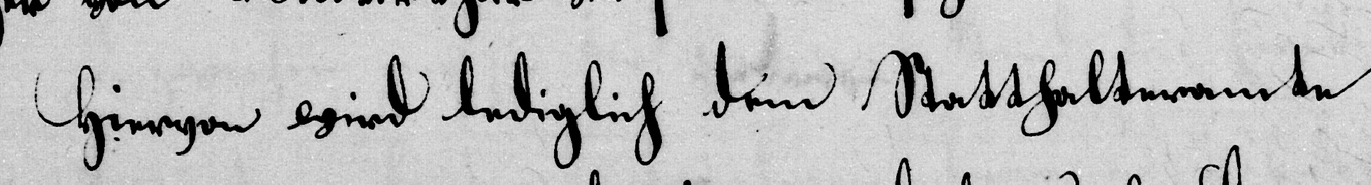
Hiervon wird lediglich dem Statthalteramte
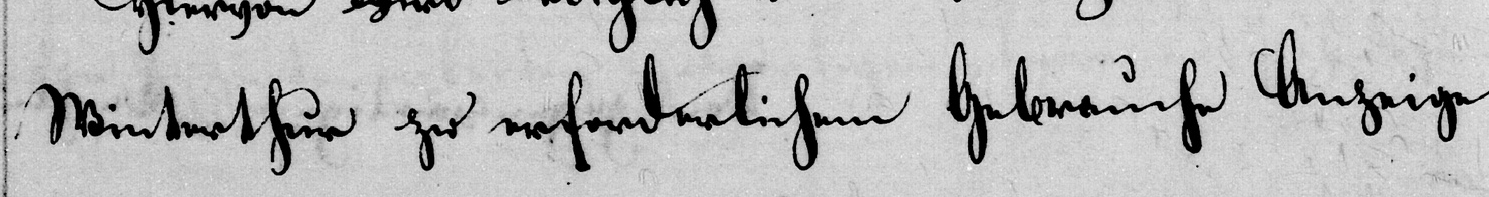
Winterthur zu erforderlichem Gebrauche Anzeige
